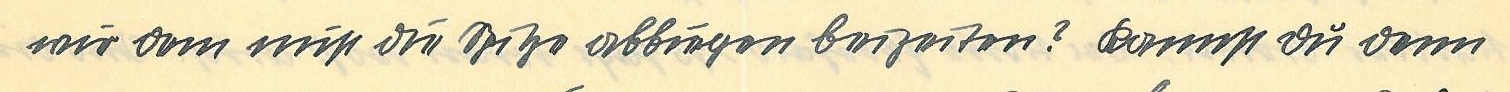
wir dem nicht die Spitze abbiegen beizeiten? Kannst Du denn
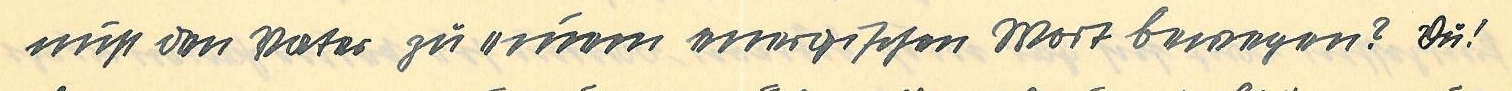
nicht den Vater zu einem energischen Wort bewegen? Du!
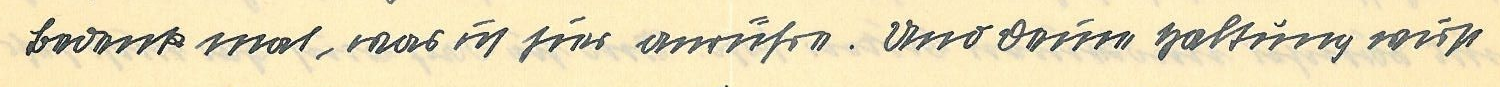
Bedenk mal, was ich hier anrühre. Und Deine Haltung wirst
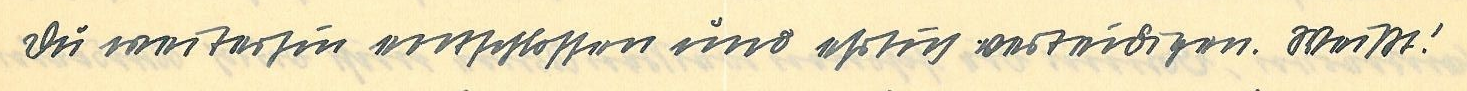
Du weiterhin entschlossen und eifrig verteidigen. Weißt!
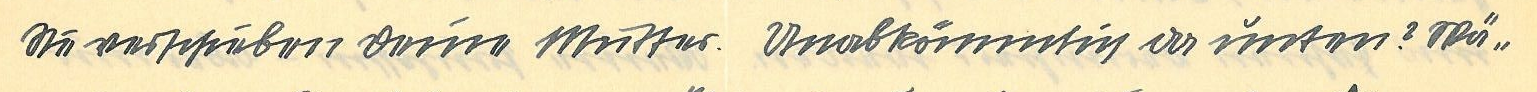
Sie verschieben Deine Mutter. Unabkömmlich da unten? Wä¬
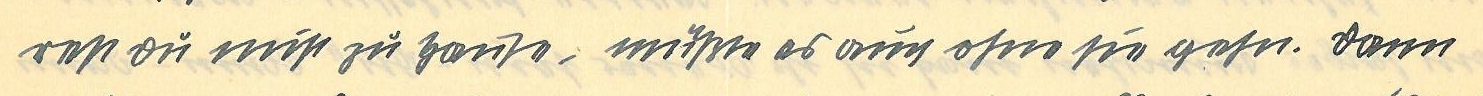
rest Du nicht zu Hause, müßte es auch ohne sie gehen. Dann
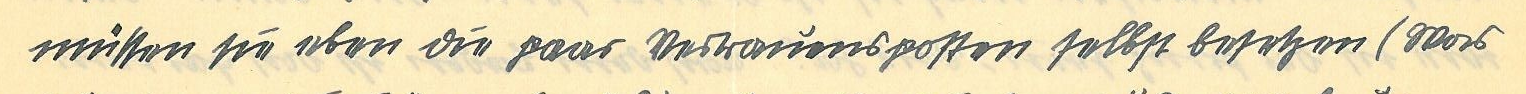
müssen sie eben die paar Vertrauensposten selbst besetzen (Was
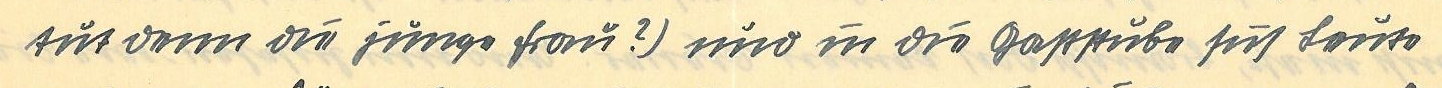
tut denn die junge Frau?) und in die Gaststube sich Leute
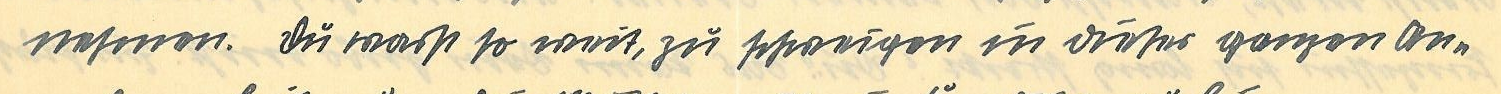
nehmen. Du warst so weit, zu schweigen zu dieser ganzen An¬
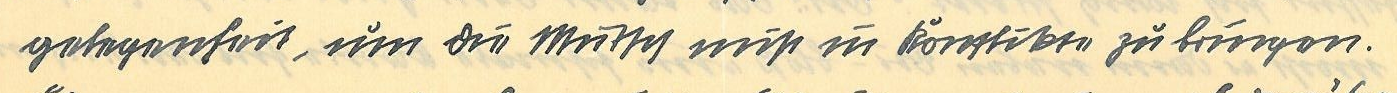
gelegenheit, um die Mutsch nicht in Konflikte zu bringen.
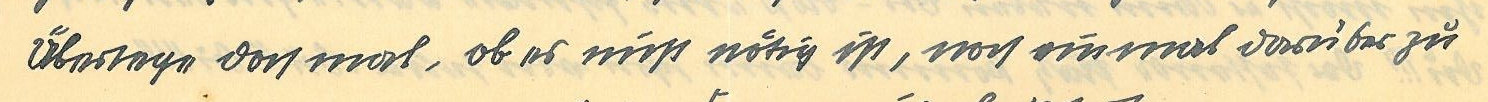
Überleg doch mal, ob es nicht nötig ist, noch einmal darüber zu
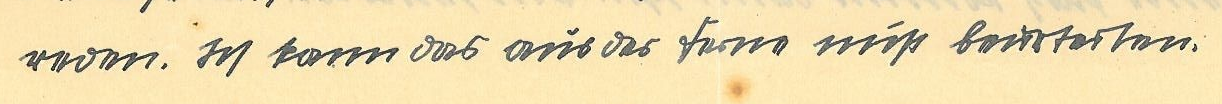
sprechen. Ich kann das aus der Ferne nicht beurteilen.
